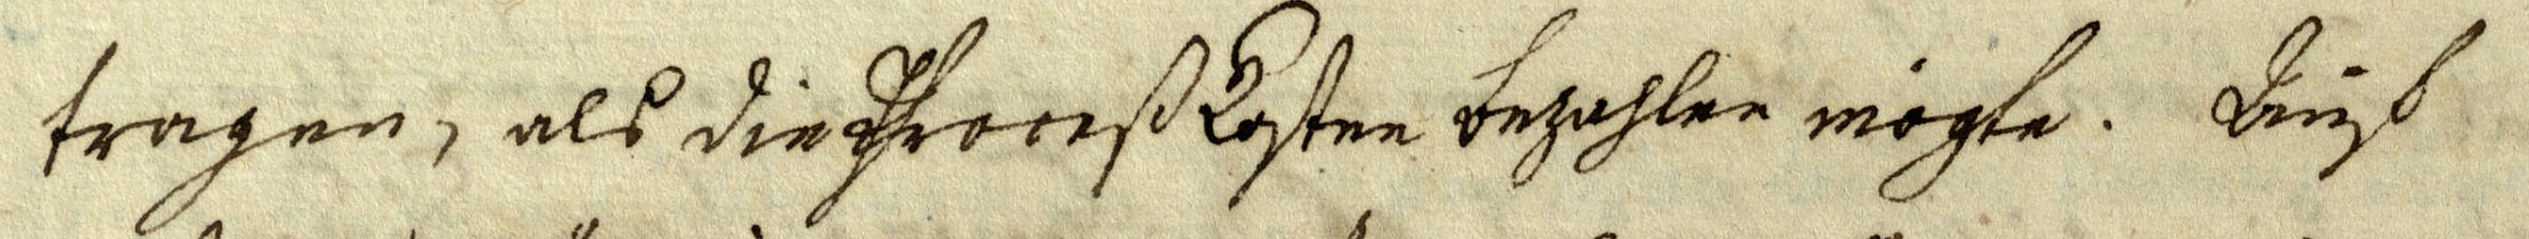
tragen, als die ProceßKosten bezahlen mögte. Auf
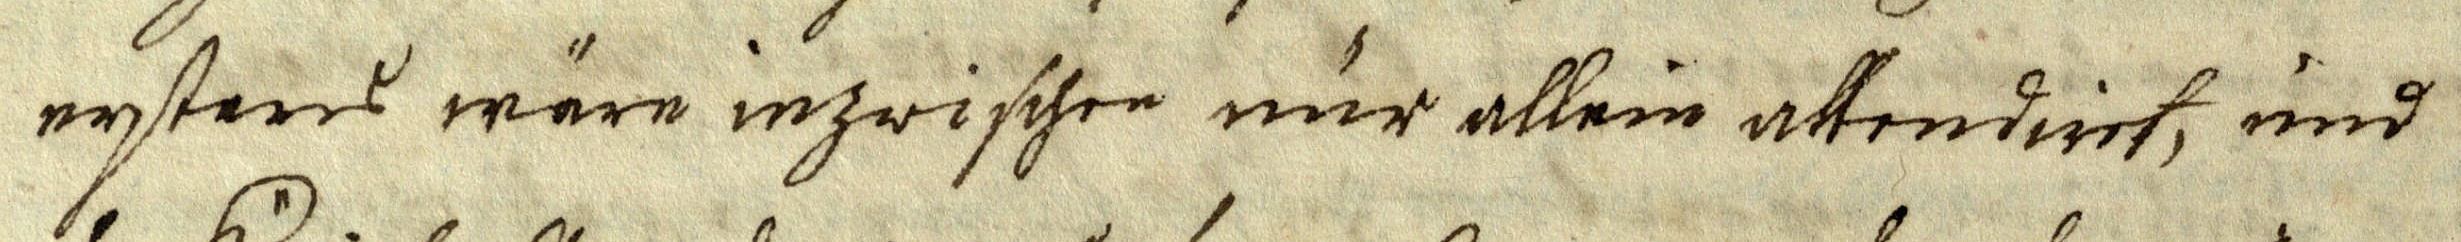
ersteres wäre inzwischen nur allein attendiret, und
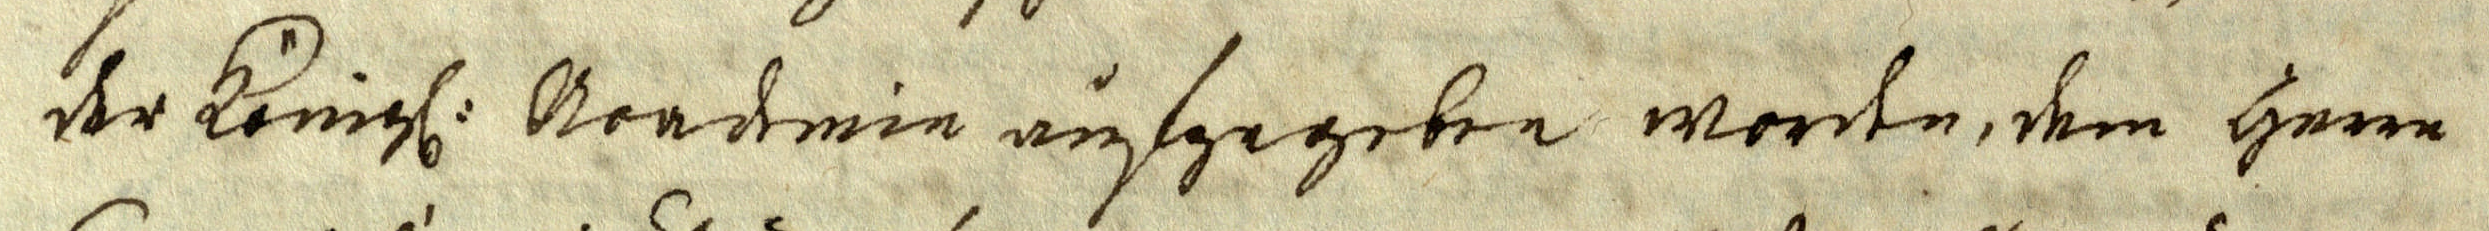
der Königl. Academie aufgegeben worden, dem Herrn
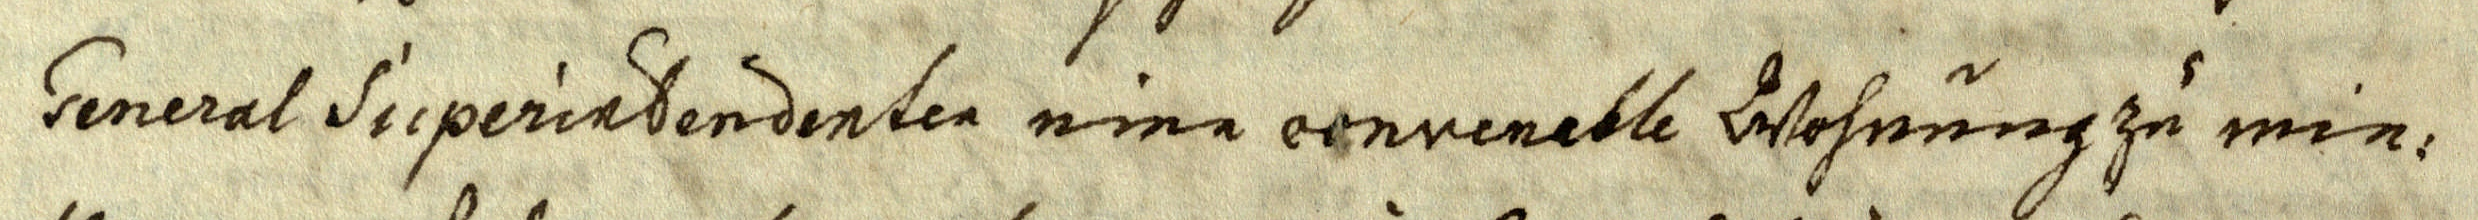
General Superintendenten eine convenable Wohnung zu mie¬
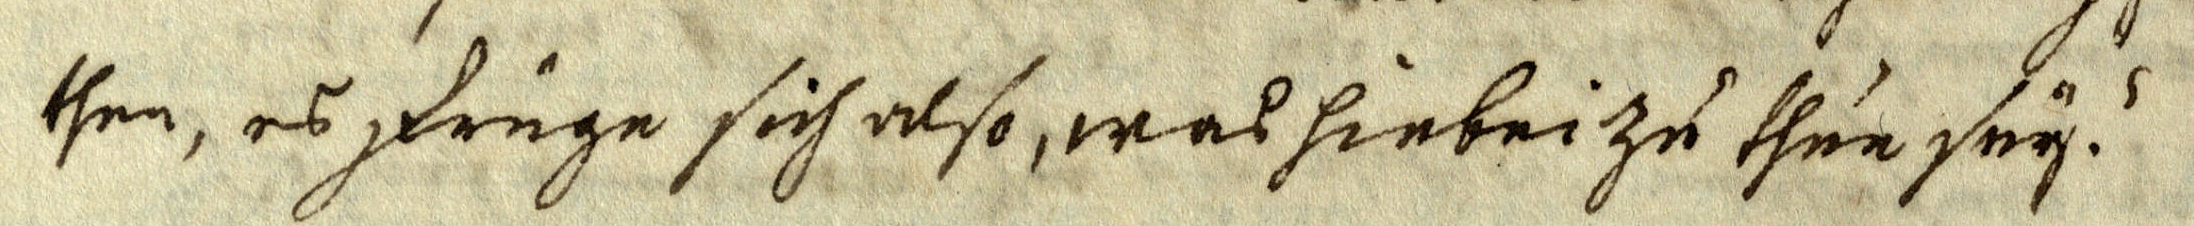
then, es früge sich also, was hiebei zu thun seÿ?
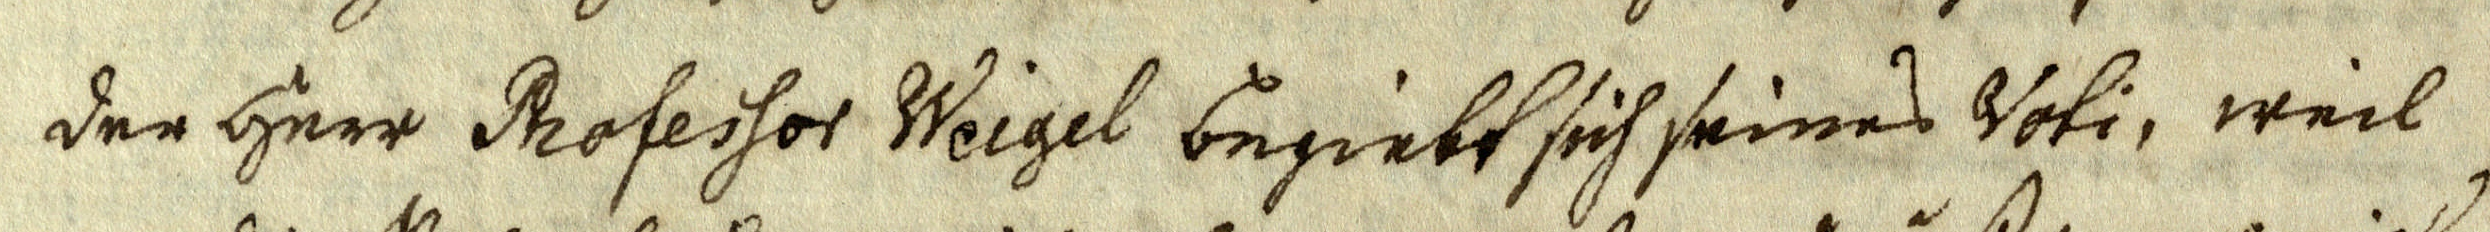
Der Herr Professor Weigel begiebt sich seines Voti, weil
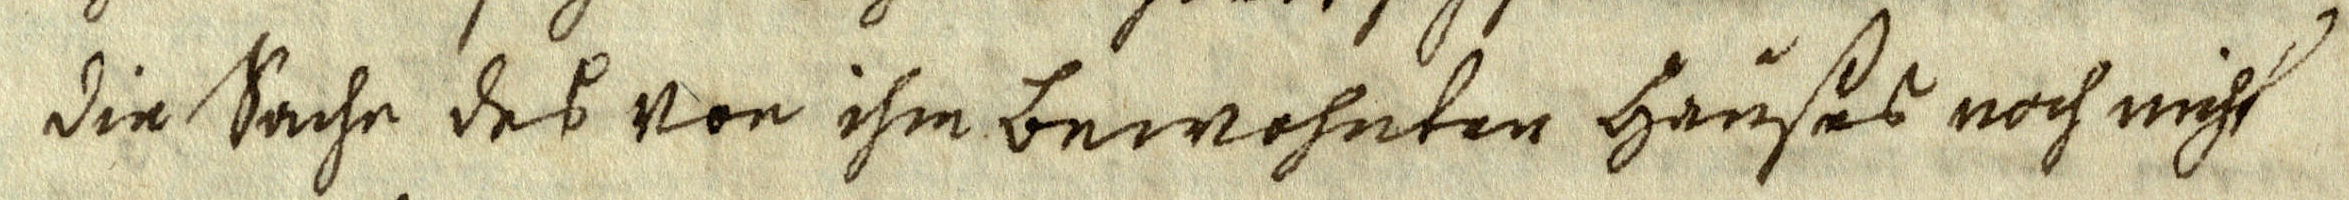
die Sache des von ihm bewohnten Hauses noch nicht
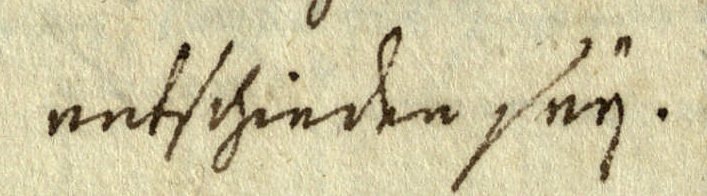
entschieden seÿ.
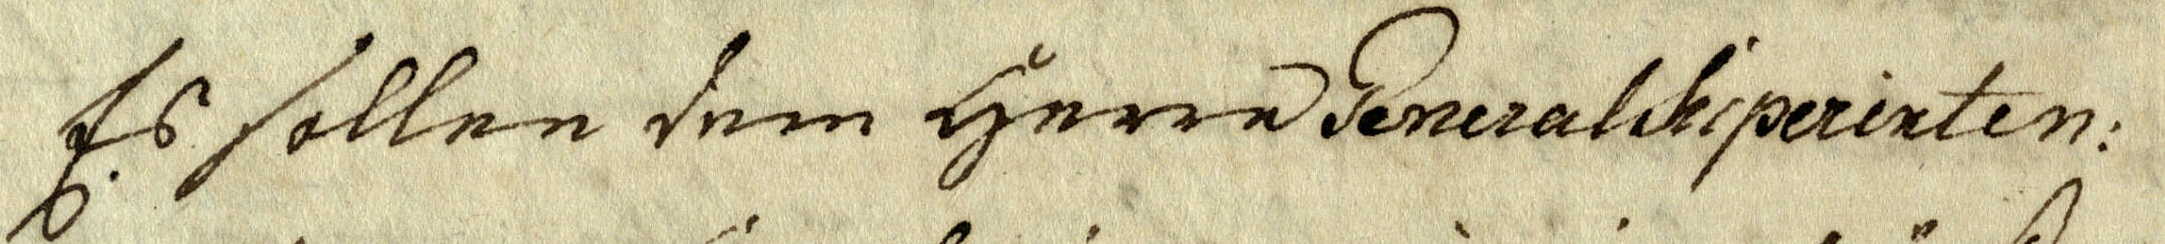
Es sollen dem Herrn GeneralSuperinten¬
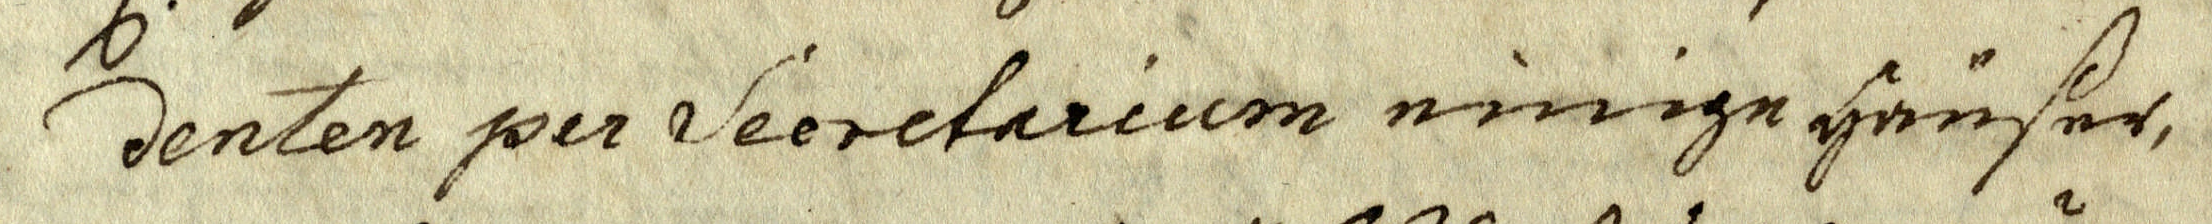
denten per Secretarium einige Häußer,
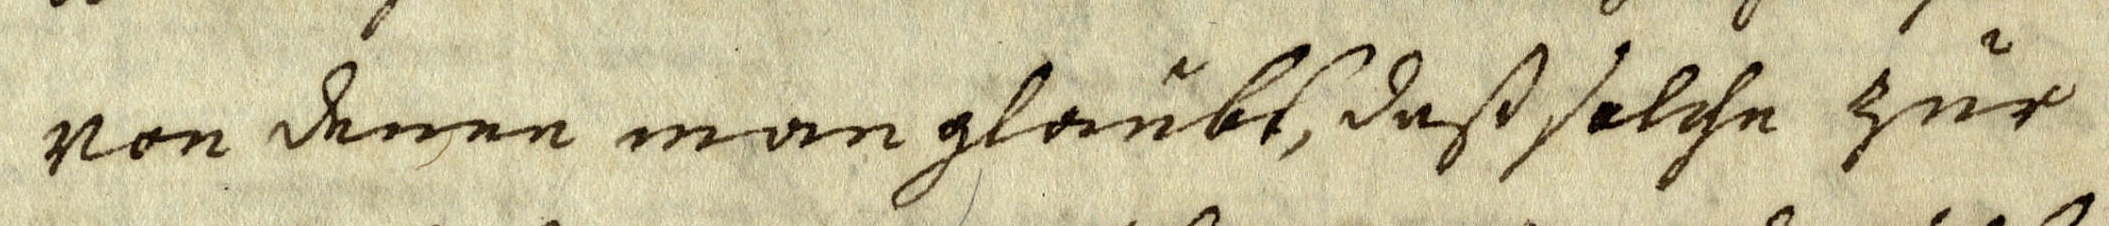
von denen man glaubt, daß solche zur
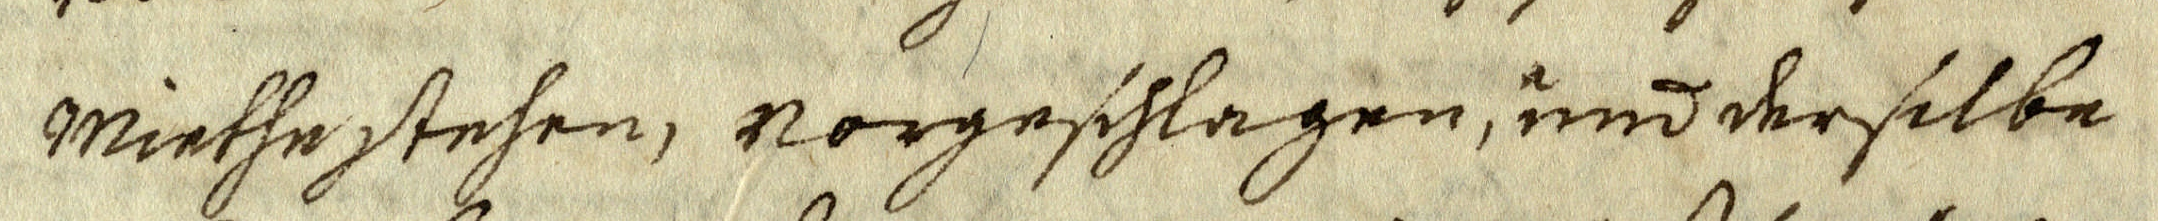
Miethe stehen, vorgeschlagen, und derselbe
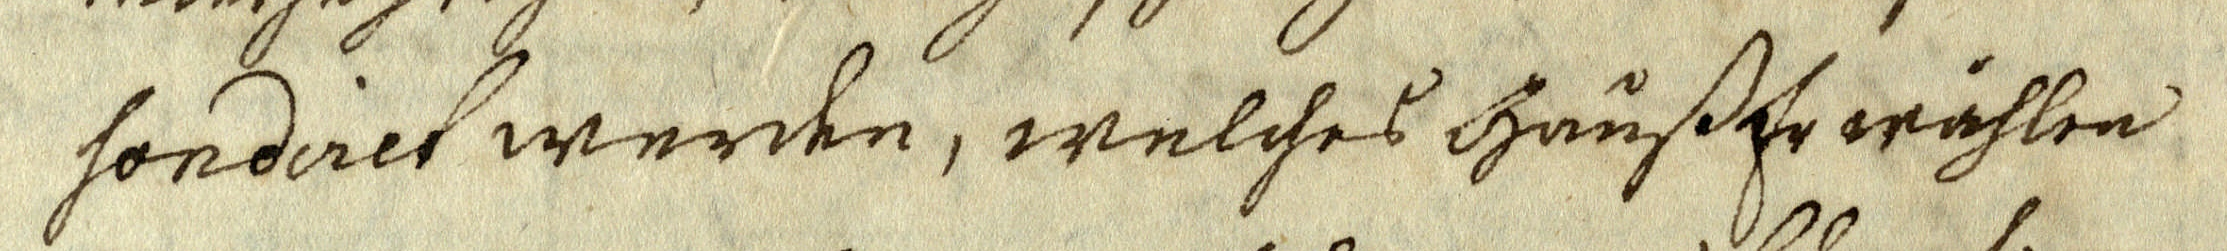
sondiret werden, welches Hauß Er wählen
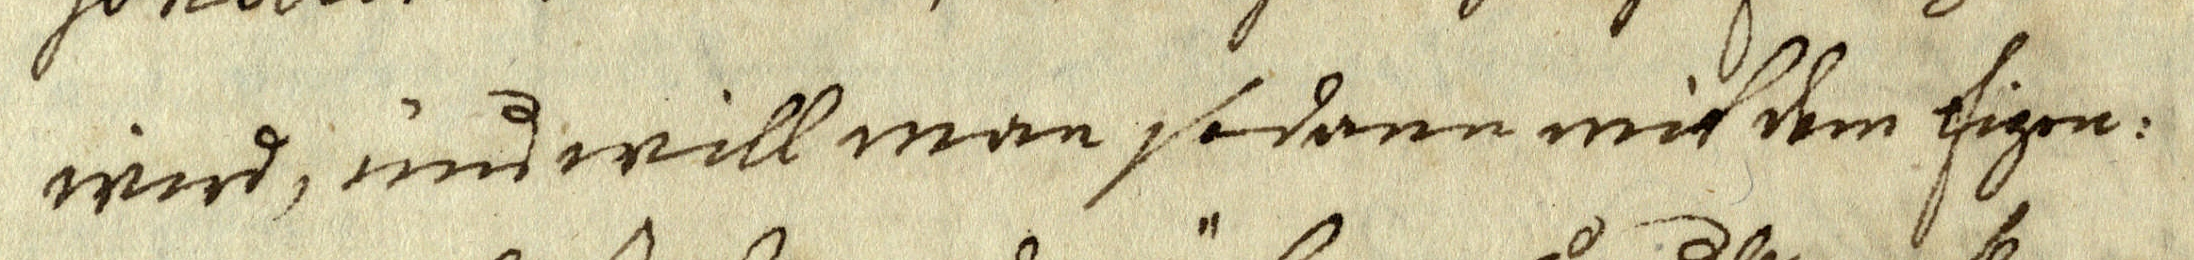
wird, und will man sodann mit dem Eigen¬
